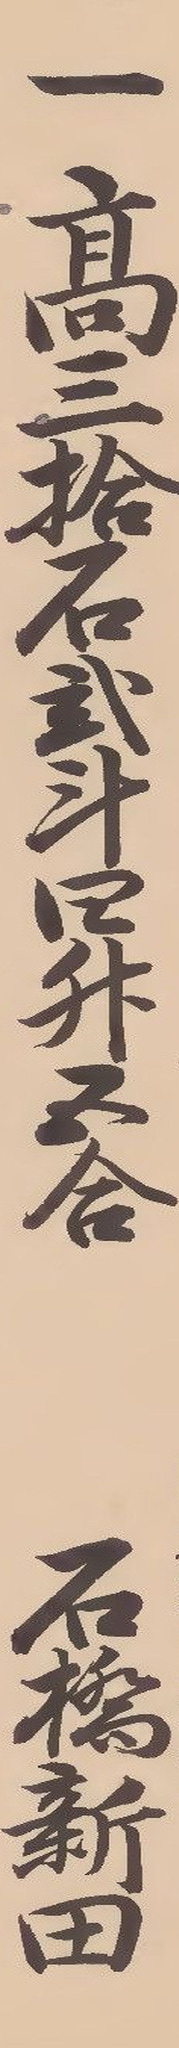一高三拾石弐斗四升五合石橋新田
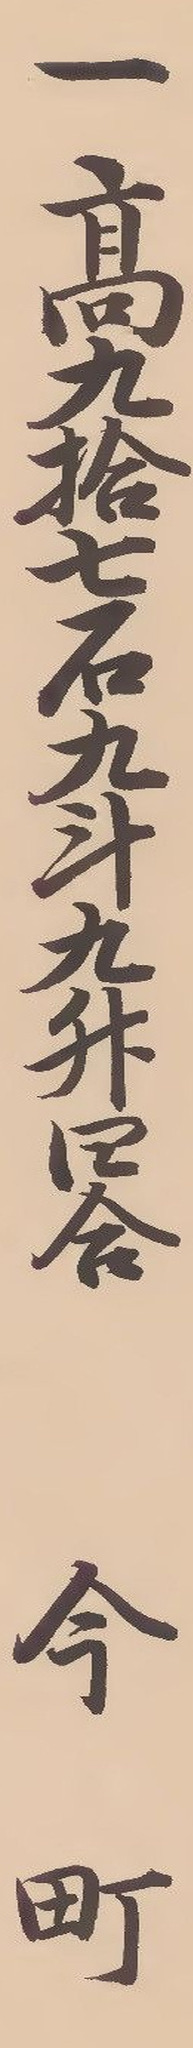一高九拾七石九斗九升四合今町
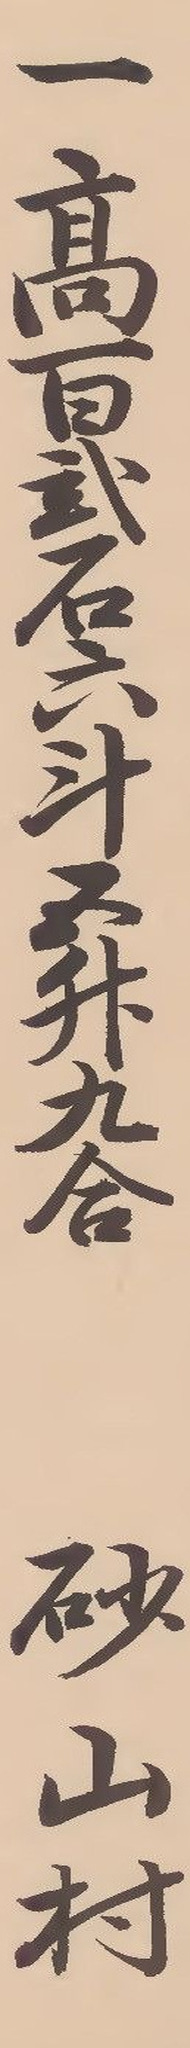一高百弐石六斗五升九合砂山村
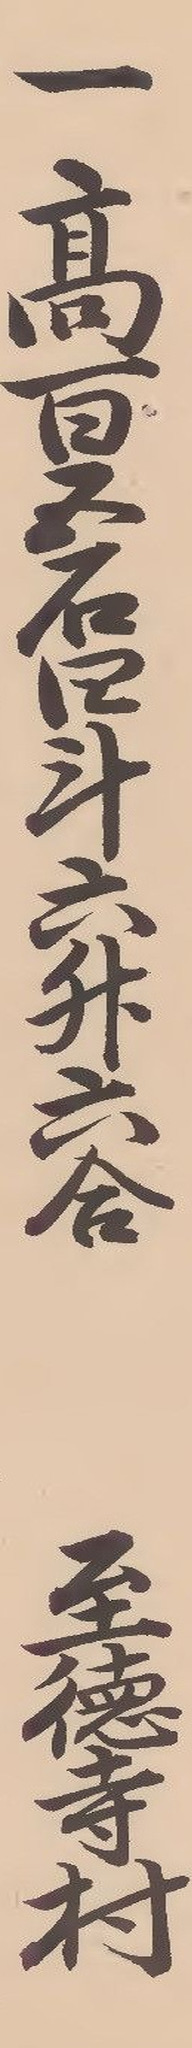一高百五石四斗六升六合至徳寺村
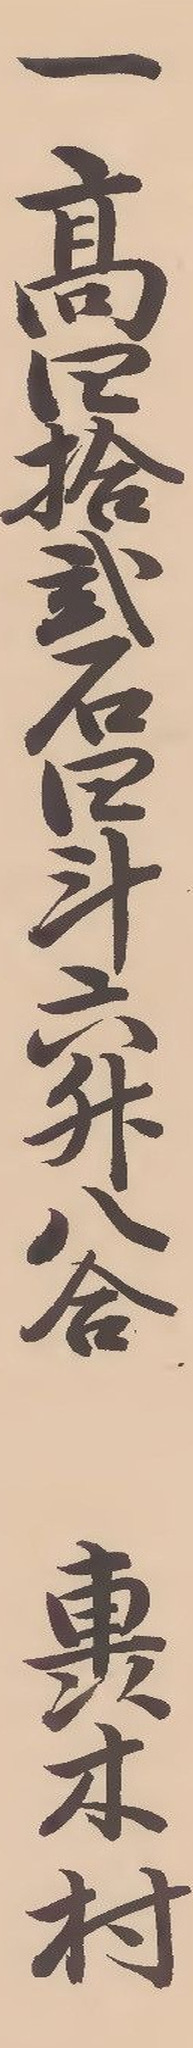一高四拾弐石四斗六升八合轟木村
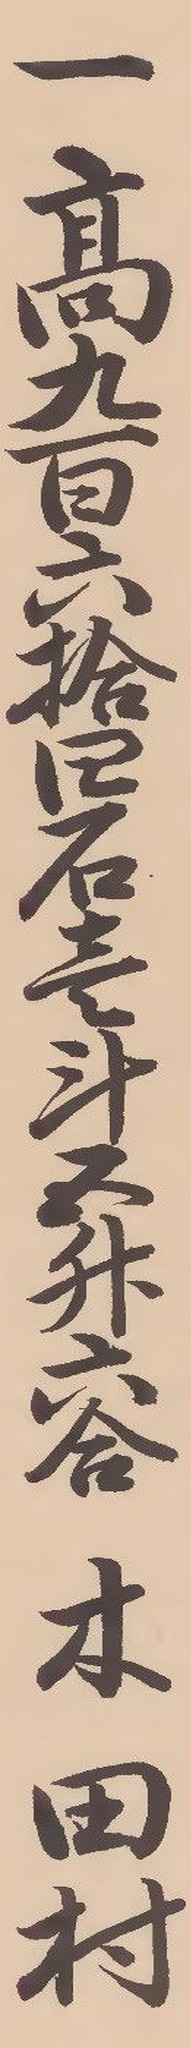一高九百六拾四石壱斗五升六合木田村

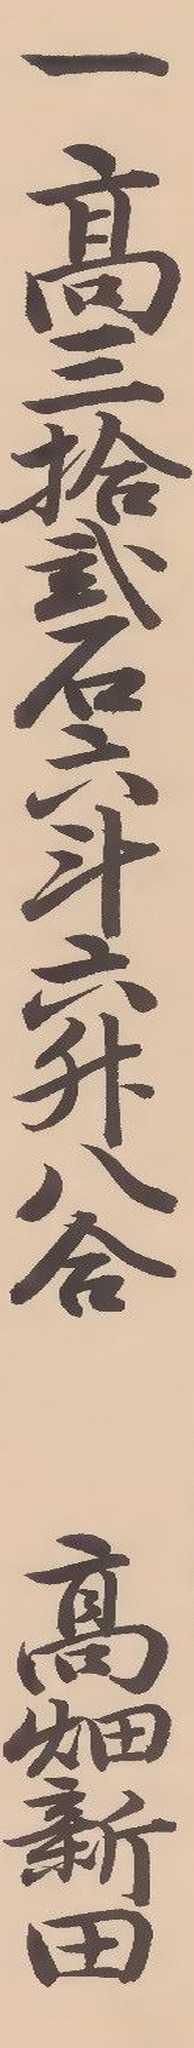一高三拾弐石六斗六升八合高畑新田
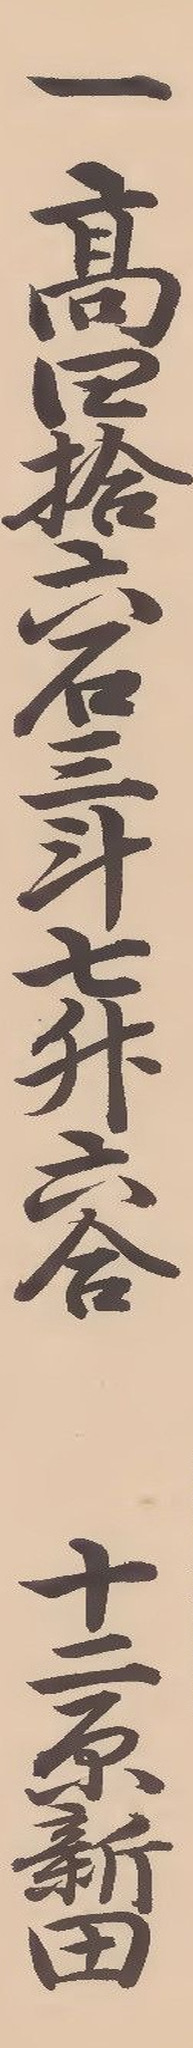一高四拾六石三斗七升六合十二原新田
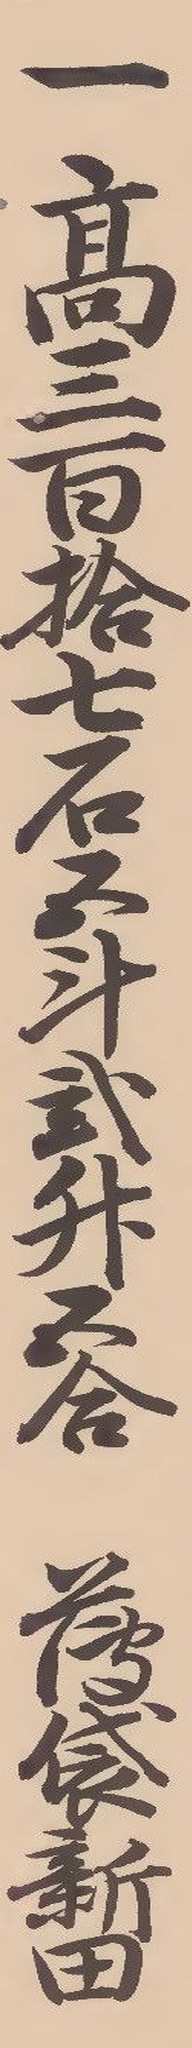一高三百拾七石五斗弐升五合薄袋新田
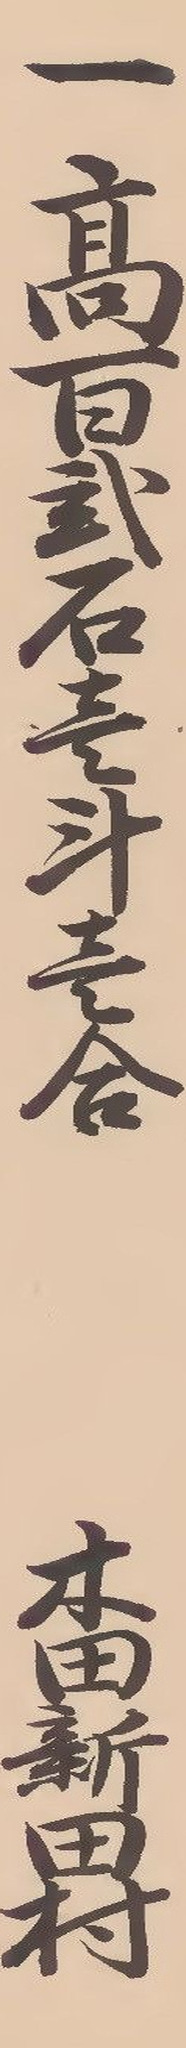一高百弐石壱斗壱合木田新田村
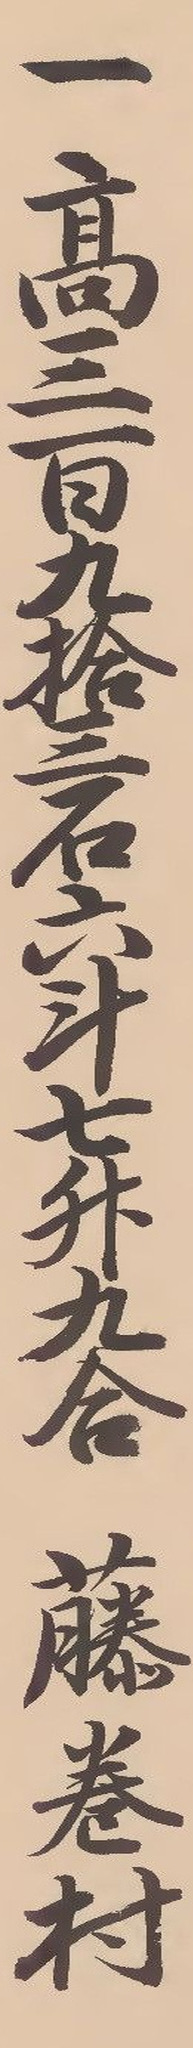一高三百九拾三石六斗七升九合藤巻村
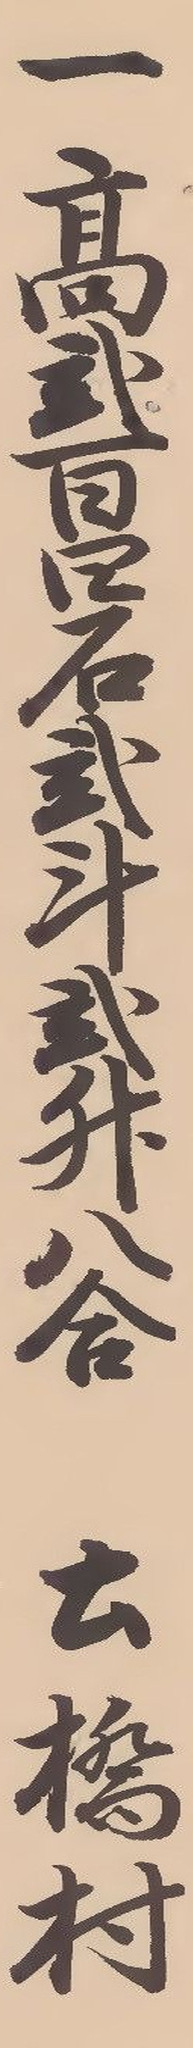一高弐百四石弐斗弐升八合土橋村
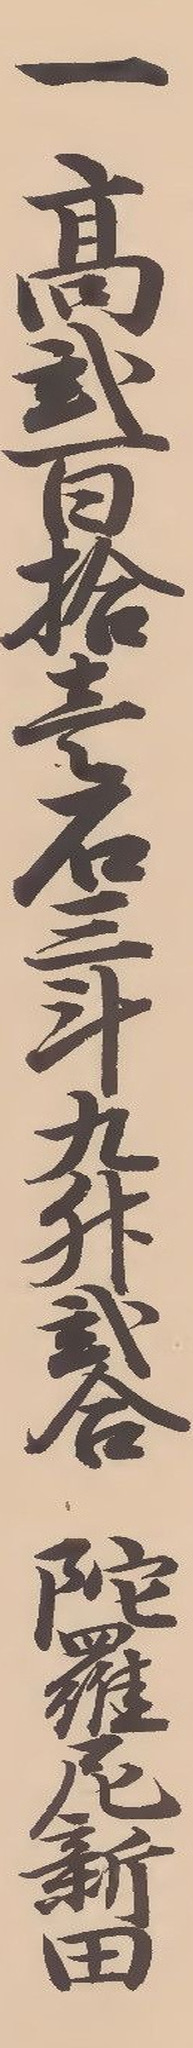一高弐百拾壱石三斗九升弐合陀羅尼新田
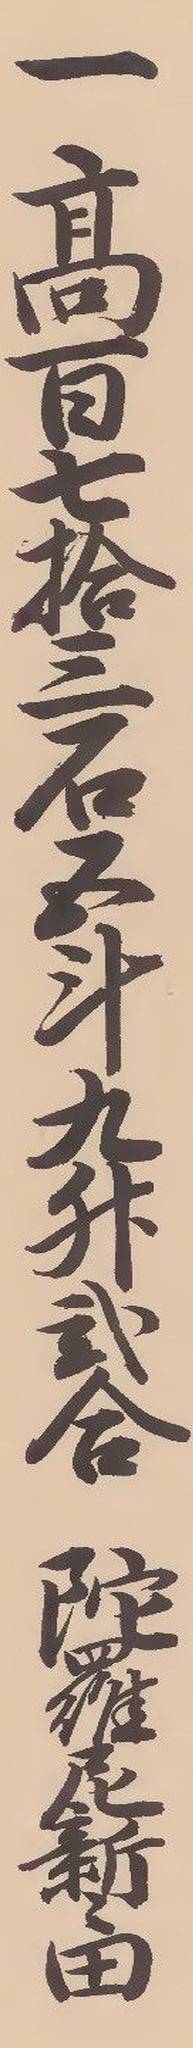一高百七拾三石五斗九升弐合阿羅尾新々田

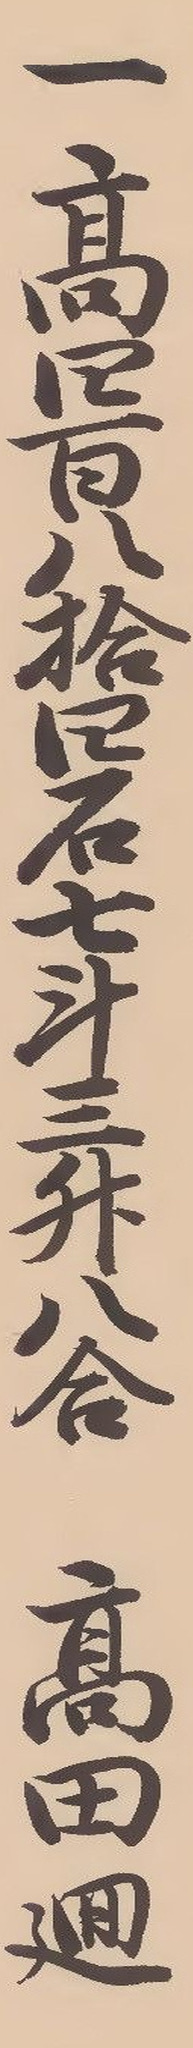一高四百八拾四石七斗三升八合高田廻
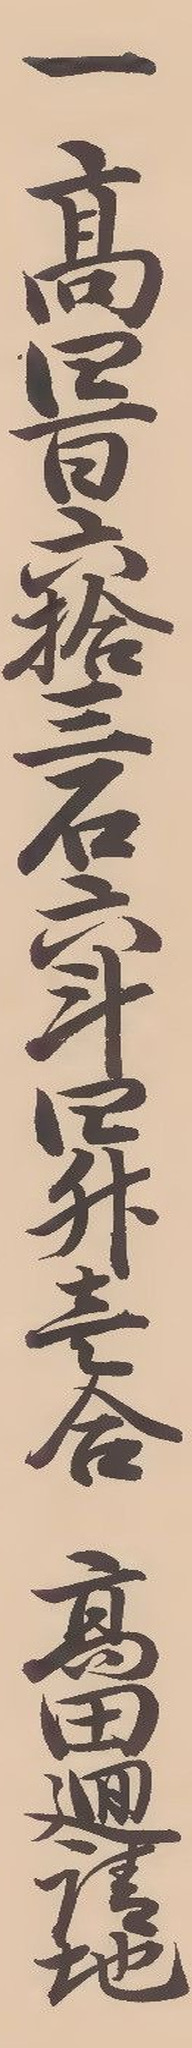一高四百六拾三石六斗四升壱合高田廻請地
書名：越後国郷帳　上
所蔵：国立公文書館 National Archives of Japan
